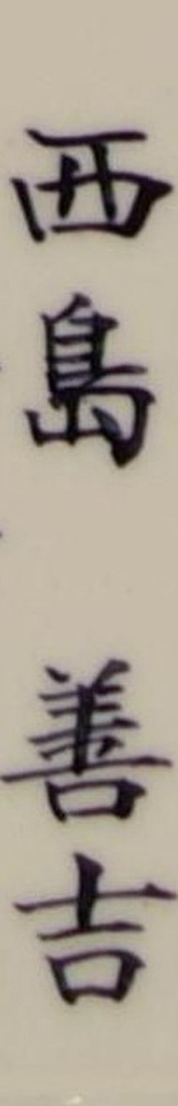西島善吉
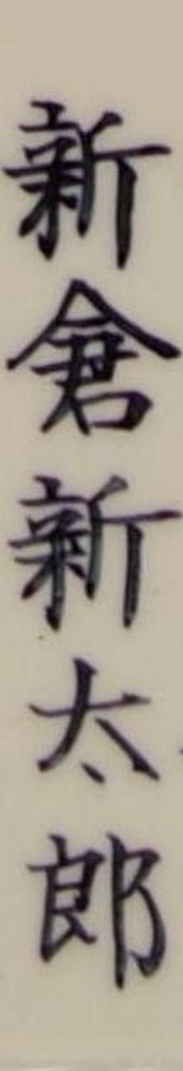新倉新太郎
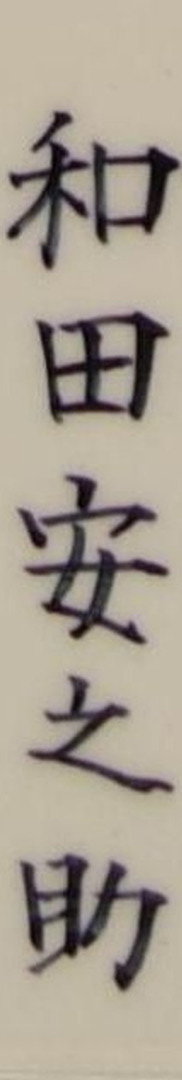和田安之助
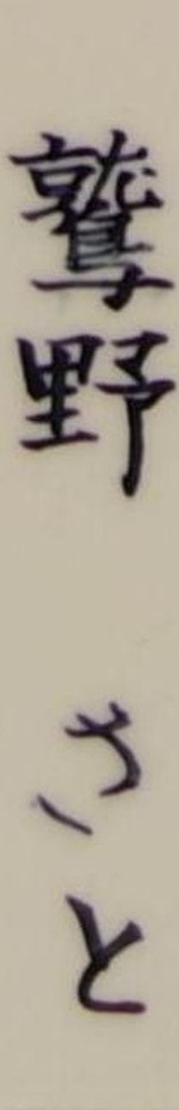鷺野さと
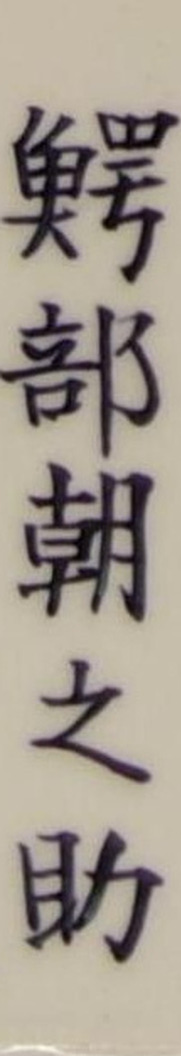鰐部朝之助
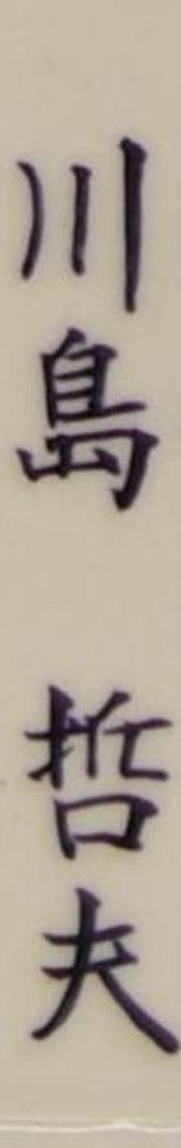川島哲夫
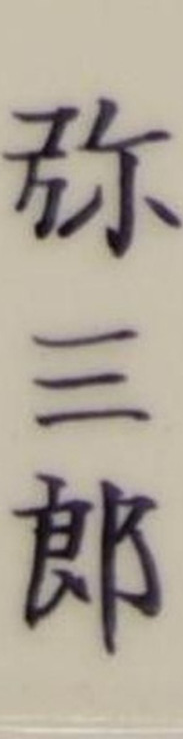弥三郎

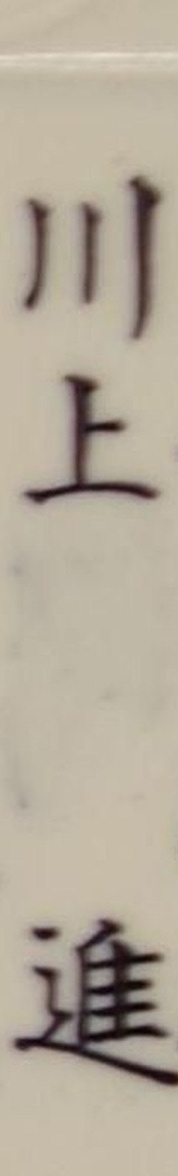川上進
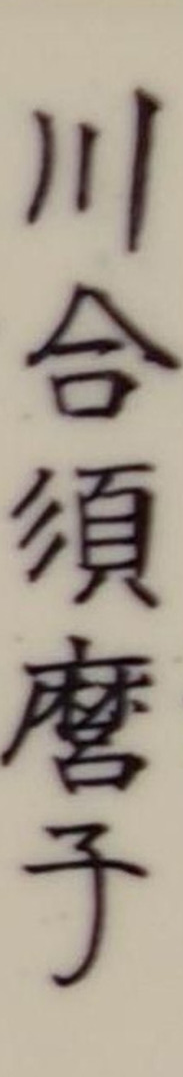川合須磨子
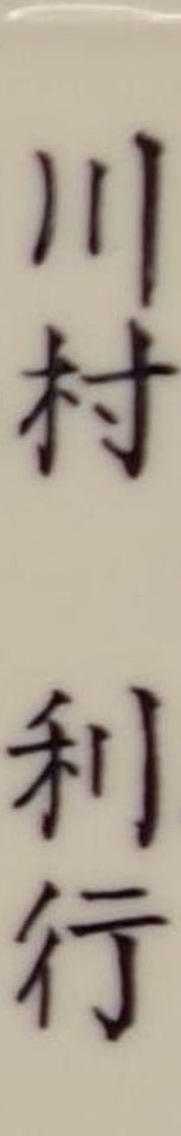川村利行
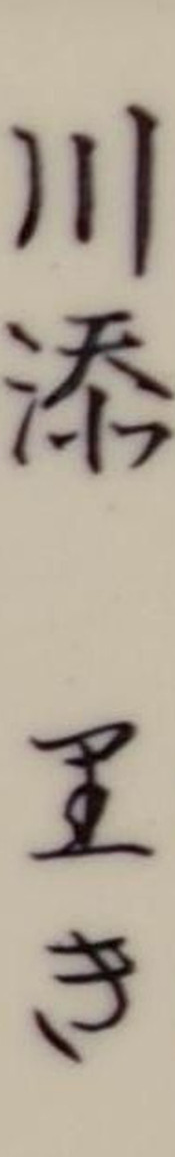川添りき
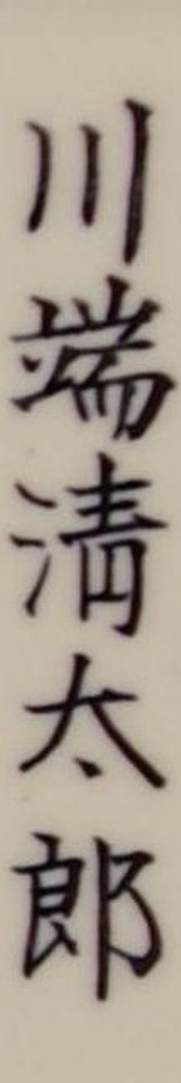川端清太郎
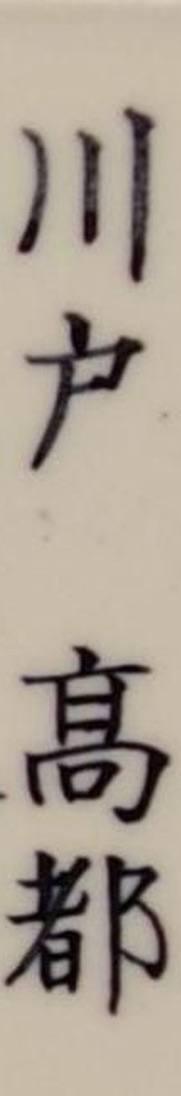川戸高都
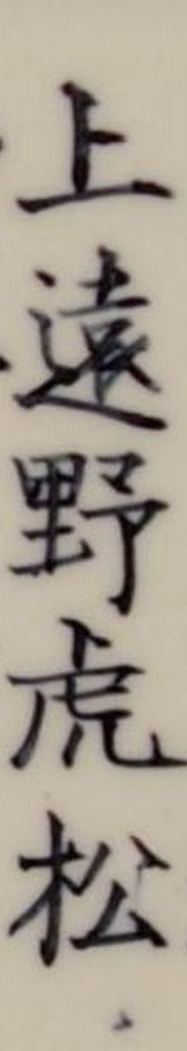上遠野虎松
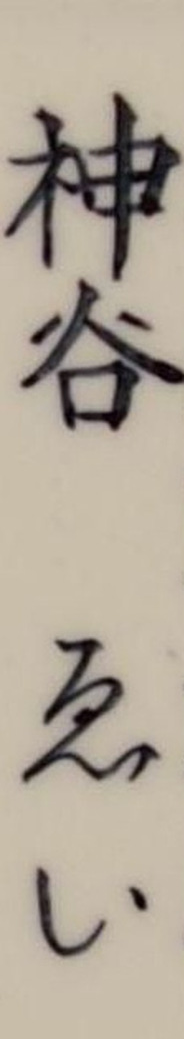神谷えい
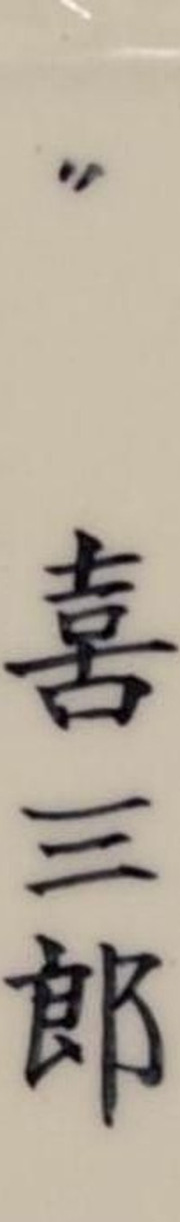喜三郎
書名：E~L
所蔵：高野山金剛峯寺
